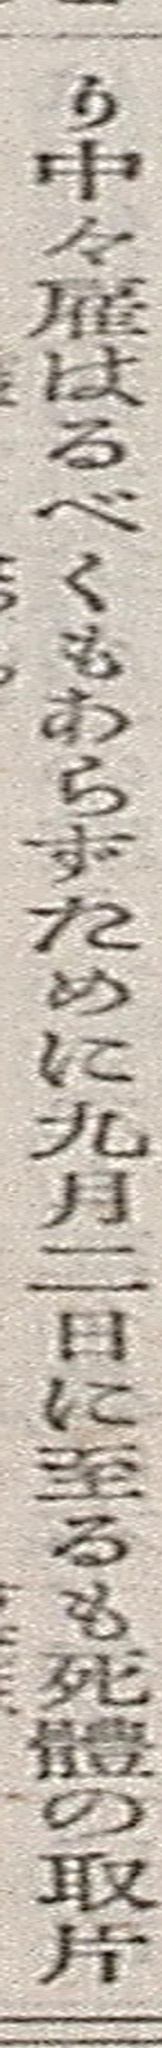り中々雇はるべくもあらずために九月二日に至るも死体の取片
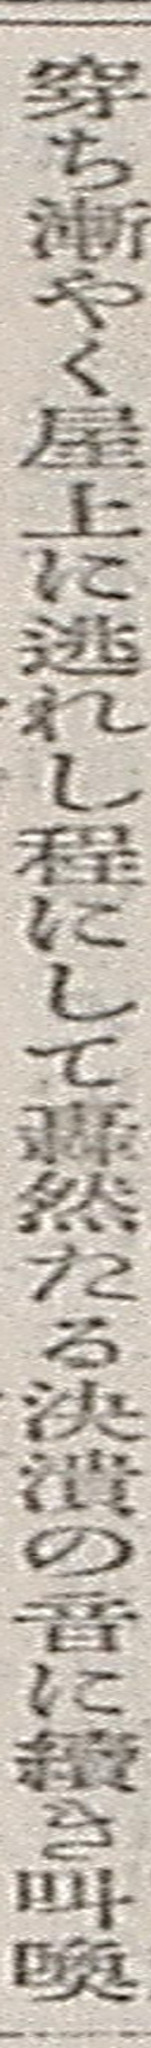穿ち漸やく屋上に逃れし程にして轟然たる决潰の音に続き叫喚
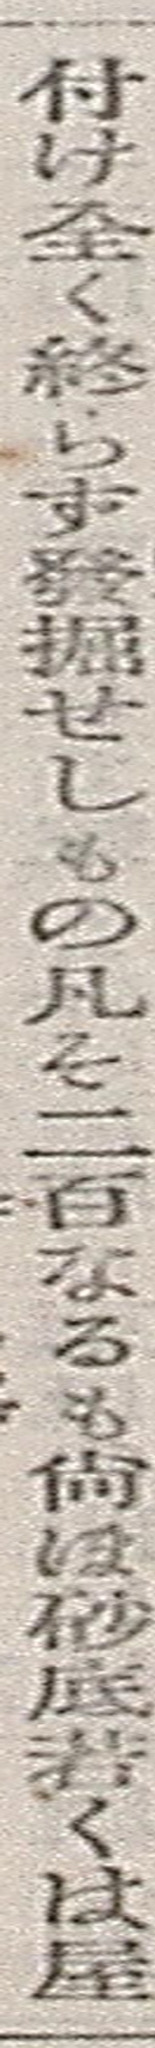付け全く終らず発掘せしもの凡そ二百なるも尚ほ砂底若くは屋
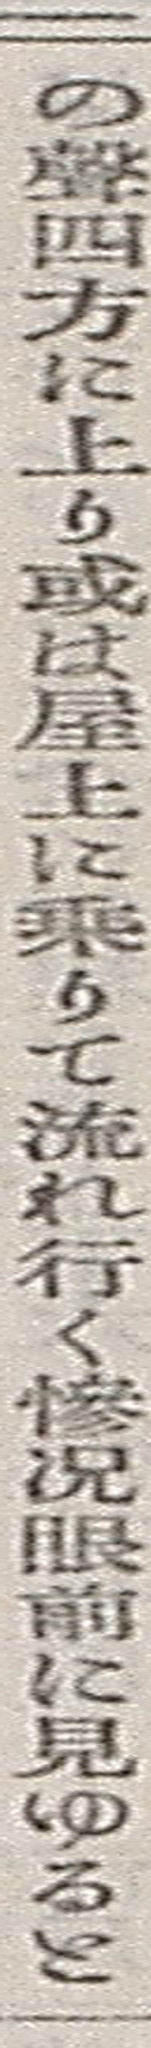の声四方に上り或は屋上に乗りて流れ行く惨況眼前に見ゆると
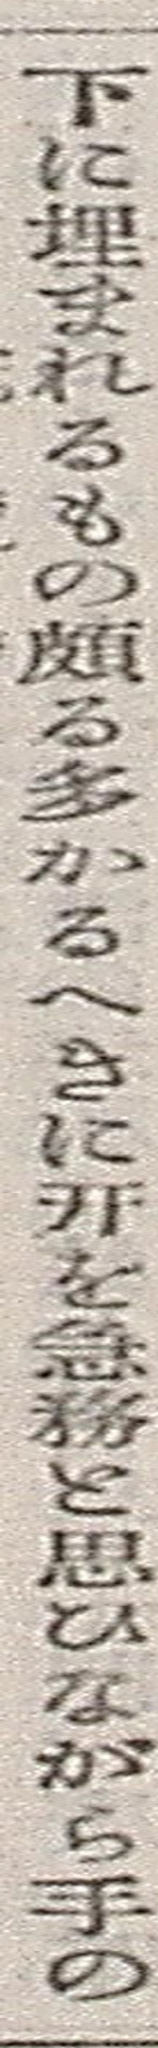下に埋まれるもの頗る多かるへきに口を急務と思ひながら手の
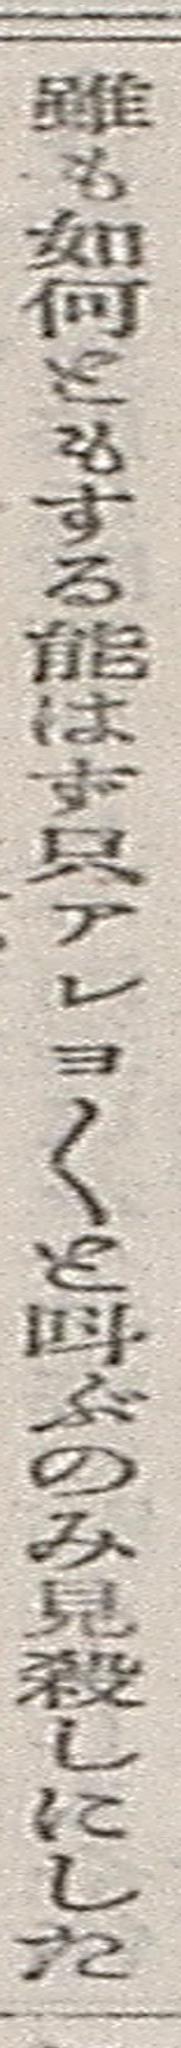誰も如何ともする能はず只アレヨ〳〵と叫ぶのみ見殺しにした
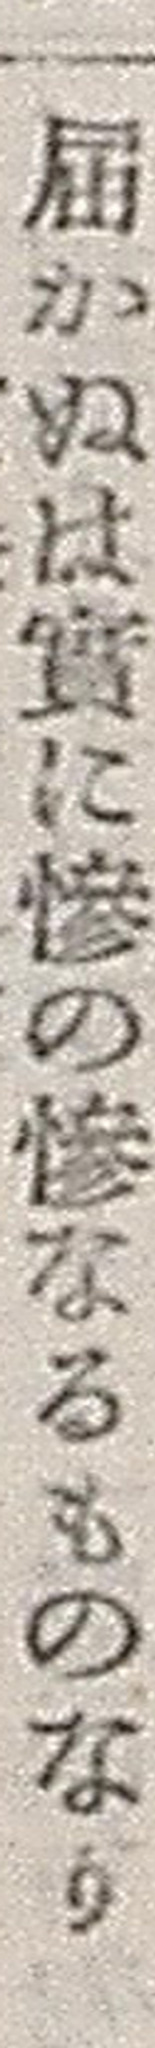届かぬは実に惨の惨なるものなり
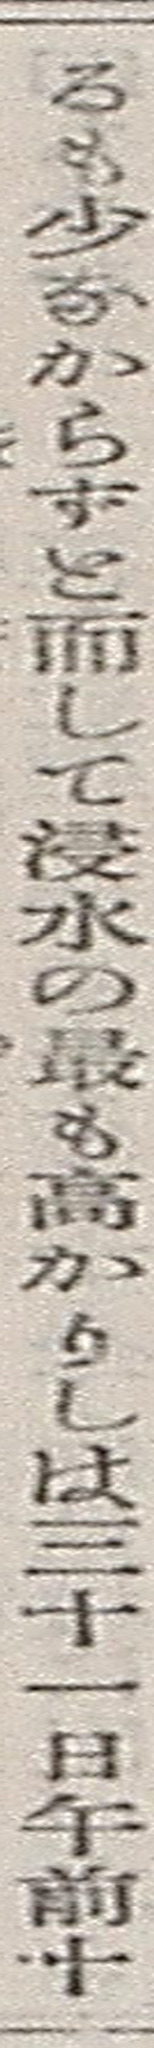るも少なからずと而して浸水の最も高かりしは三十一日午前十
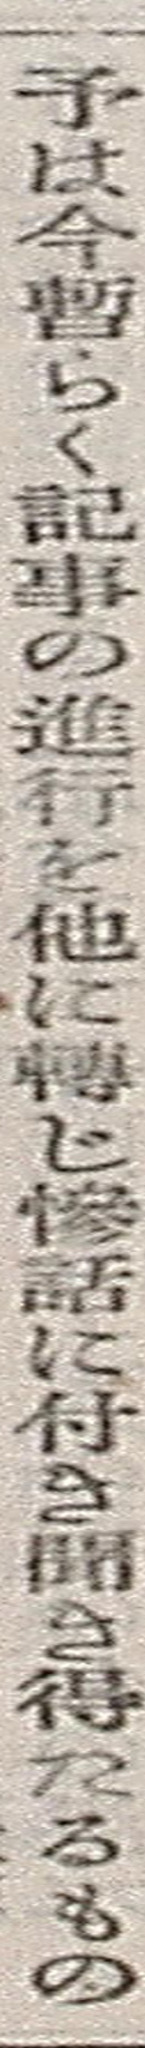予は今暫らく記事の進行を他に転じ惨話に付き聞き得たるもの
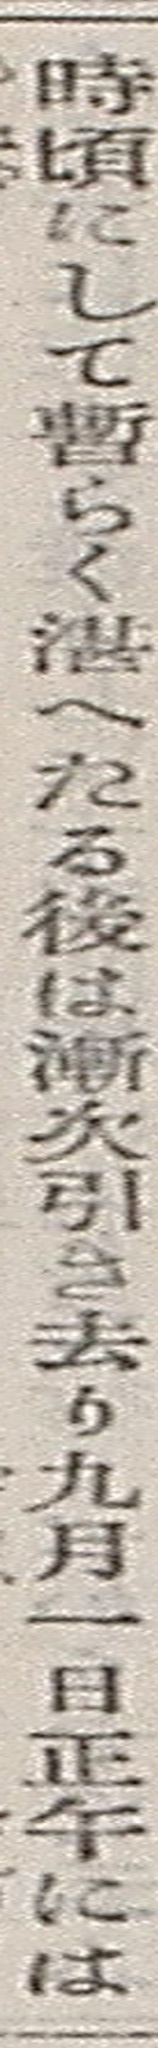時頃にして暫らく湛へたる後は漸次引き去り九月一日正午には
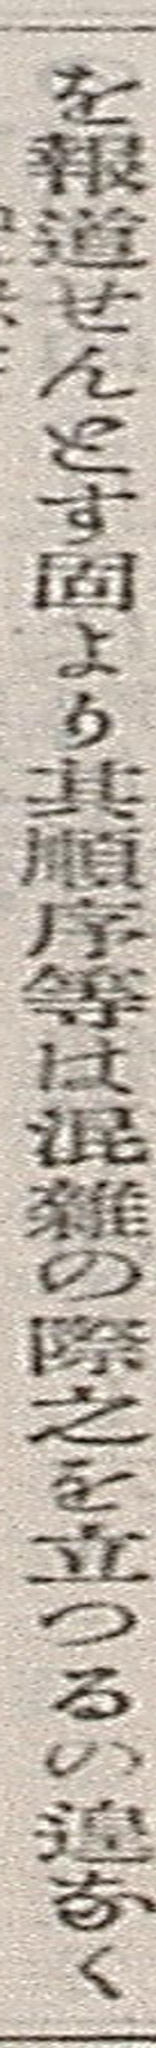を報道せんとす固より其順序等は混雑の際之を立つるの遑なく
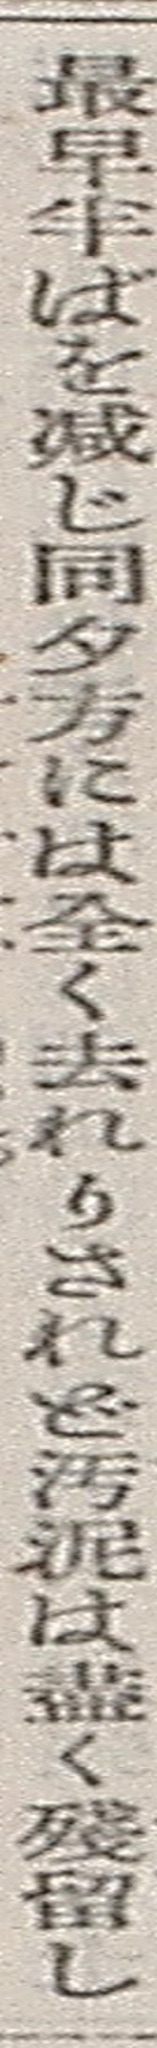最早半ばを減じ同夕方には全く去れりされど汚泥は盡く残留し
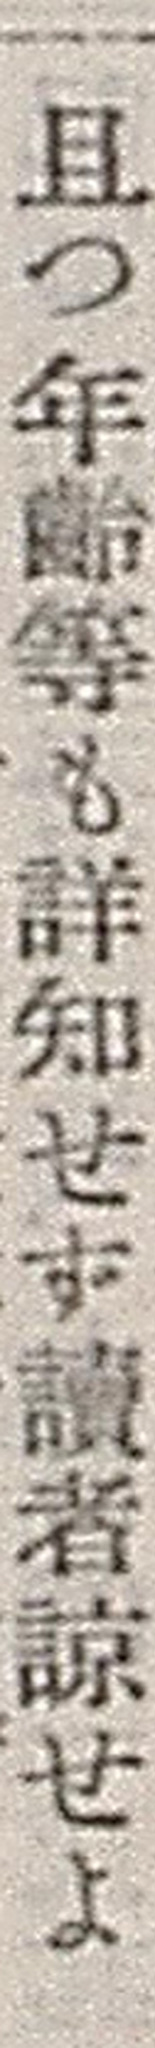且つ年齢等も詳知せず読者諒せよ
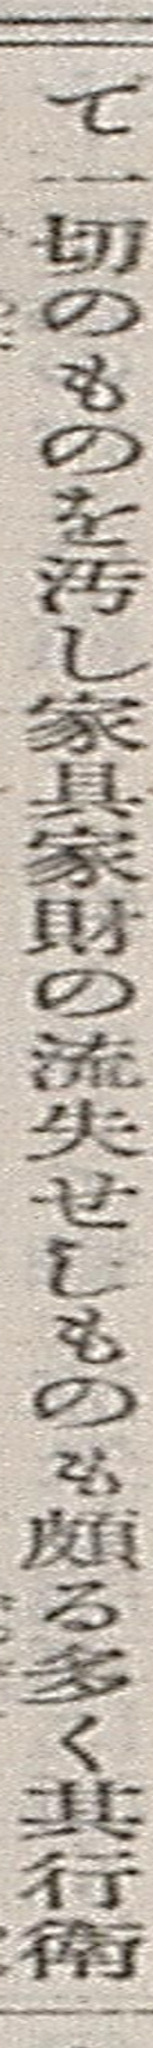て一切のものを汚し家具家財の流失せしものも頗る多く其行衛
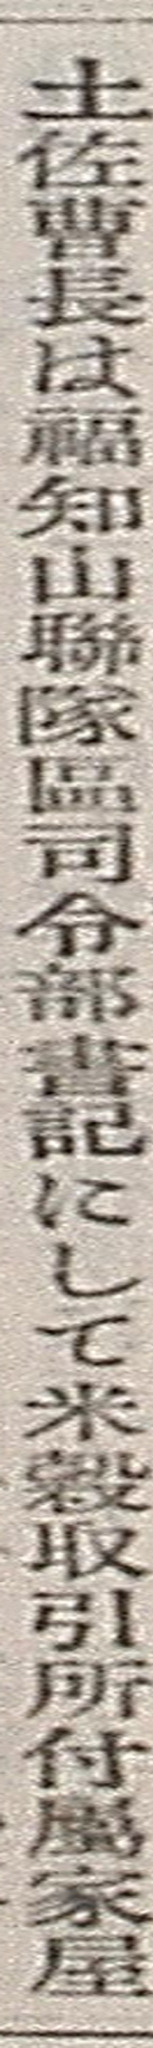土佐曹長は福知山聯隊區司令部書記にして米穀取引所付属家屋
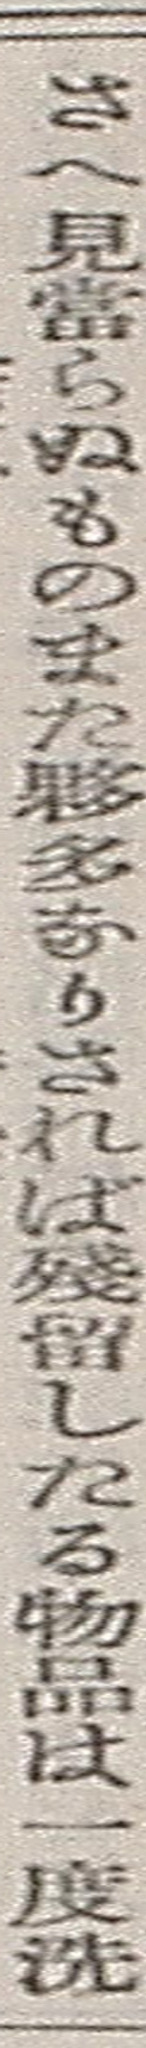さへ見当らぬものま夥多なりされば残留したる物品は一度洗
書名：風俗畫報臨時増刊第百二十六號　洪水被害録（中）
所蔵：東京大学地震研究所図書室 Earthquake Research Institute Library, The University of Tokyo, JAPAN
